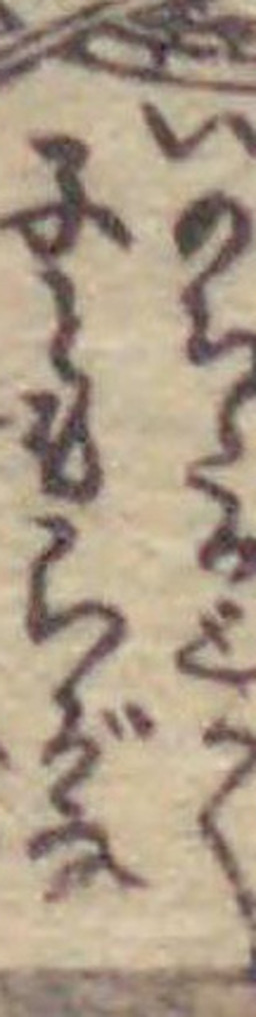子ともらがな
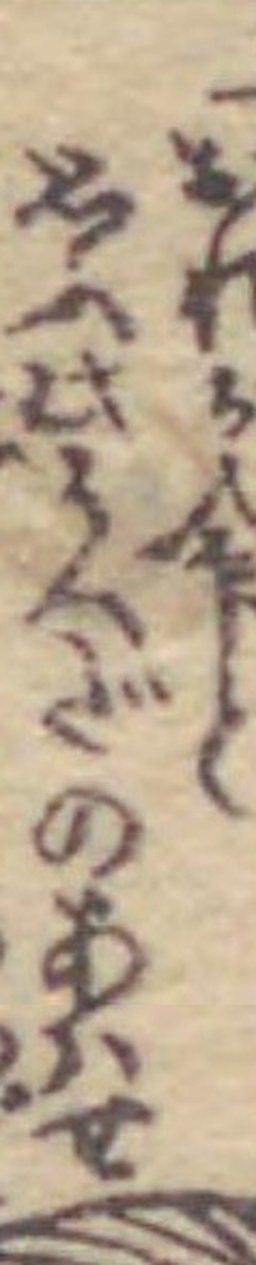思ふ此かへだのあはせ
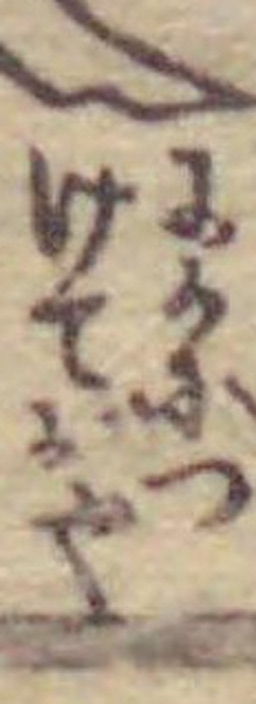けておや
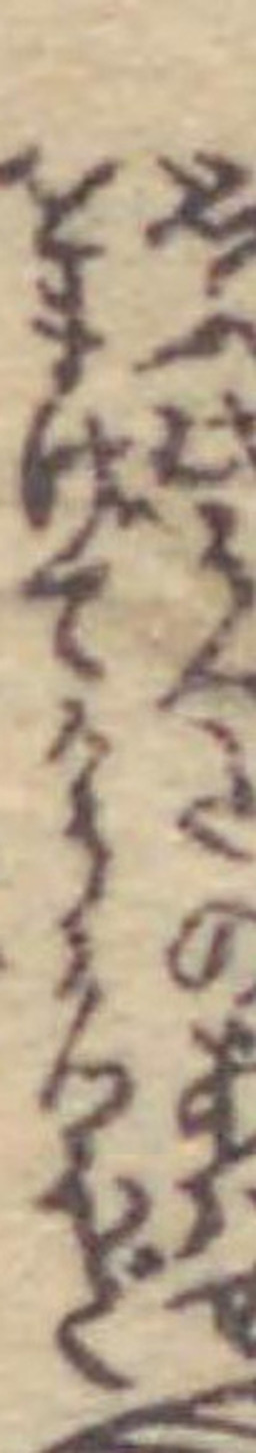をまげてかうかつほだ
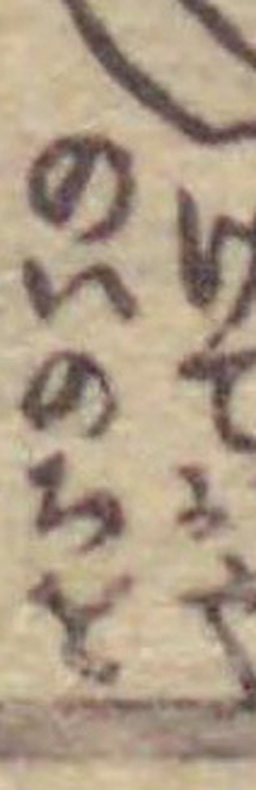のいのちを
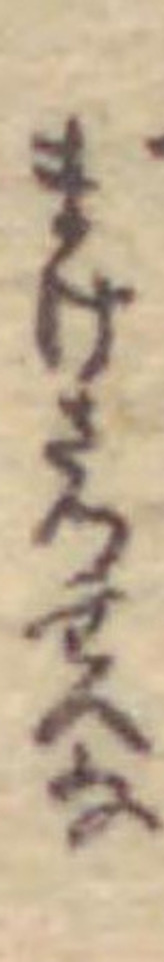まけさつせへな
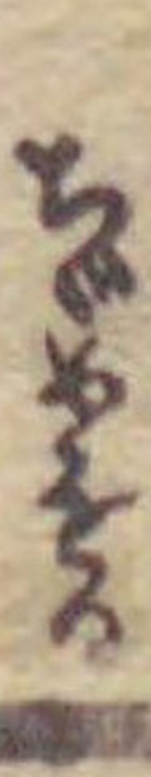ちゞめをる
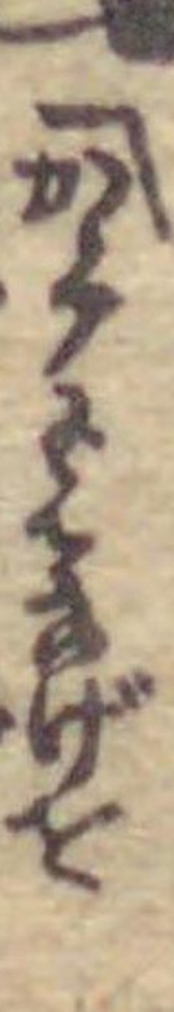〽かゝアにはなげを
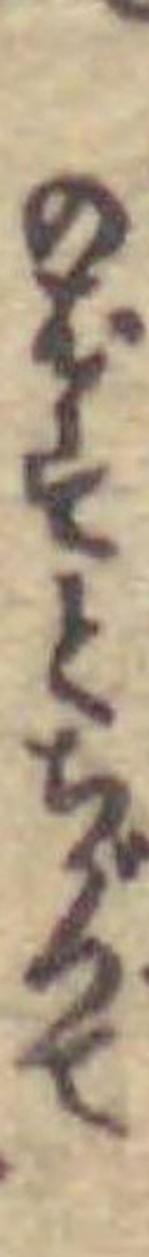のばすとちがつて
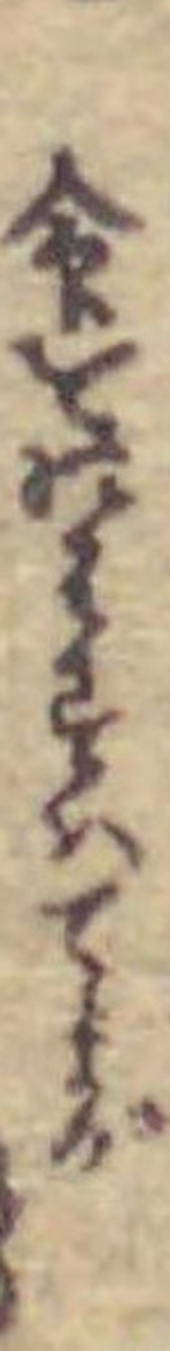命をのはすはてまが
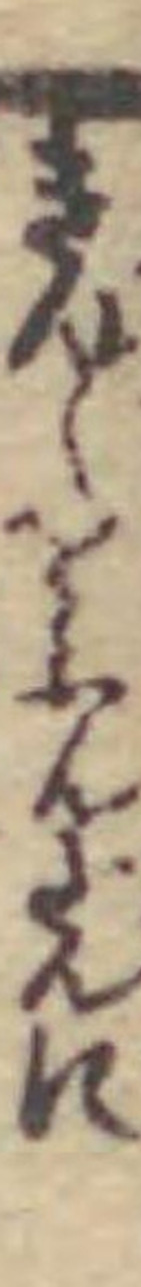きん〳〵をふんだんに
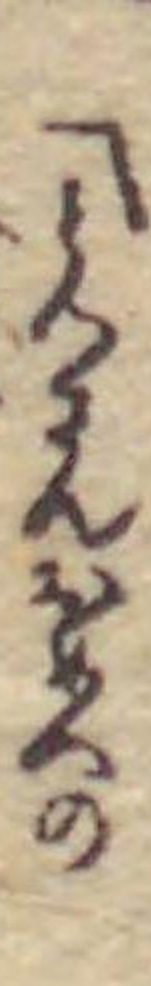〽かつさんおめへの
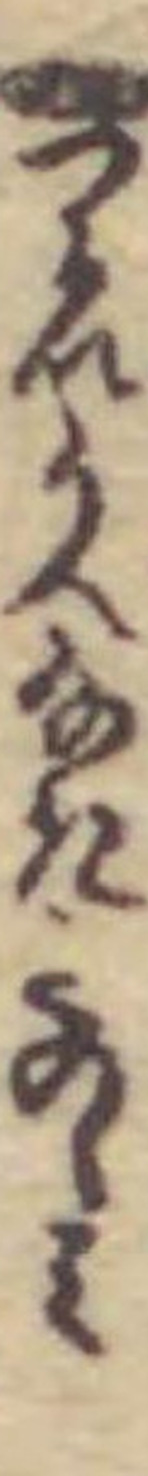つかいうへなきたのしみ
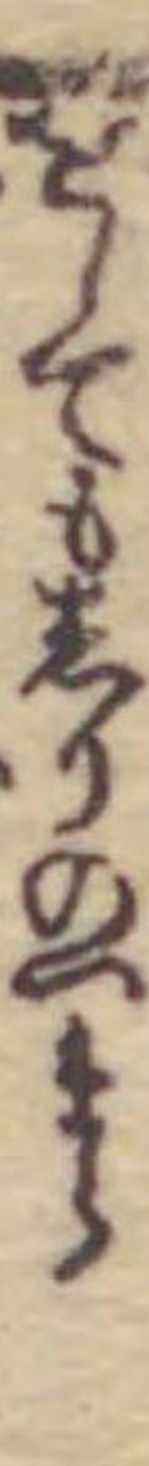をしてもしりのつまら
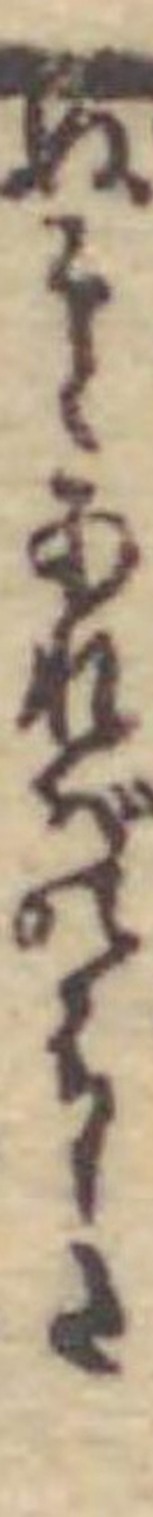ぬことあればのはした
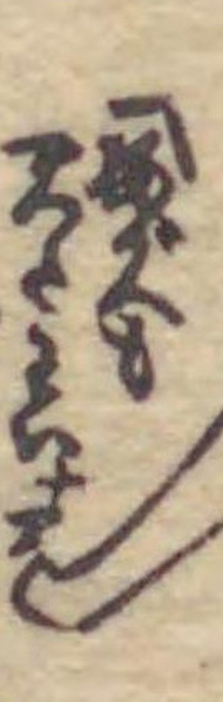〽梅がへも
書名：御誂染長寿小紋 : 3巻
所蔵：国立国会図書館 National Diet Library, JAPAN
